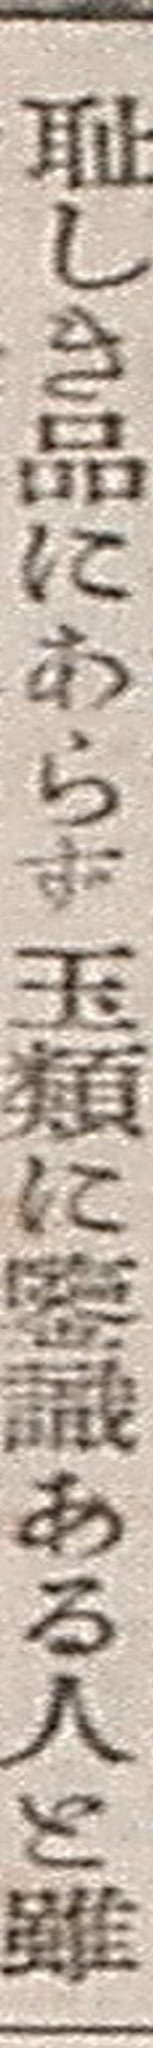恥しき品にあらず玉類に鍳識ある人と雖
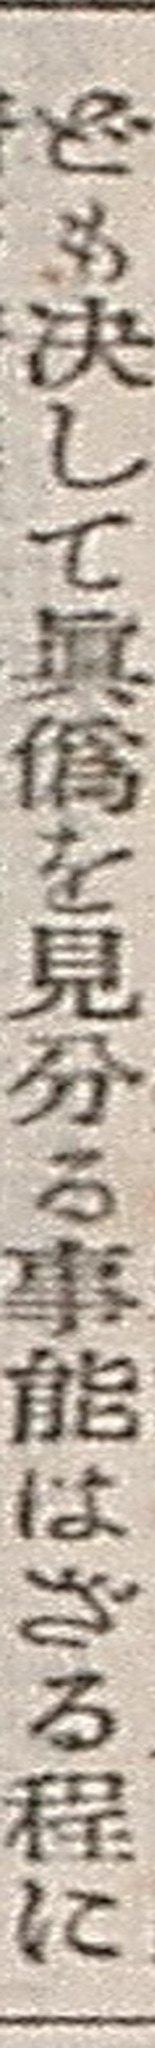ども决して真偽を見分る事能はざる程に
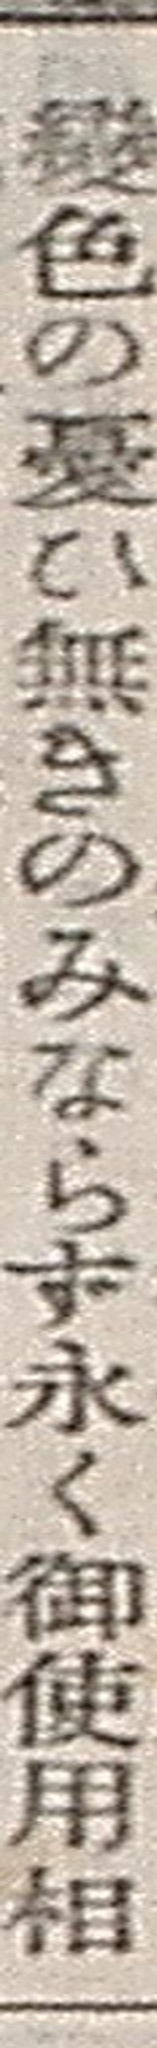変色の憂ひ無きのみならず永く御使用相
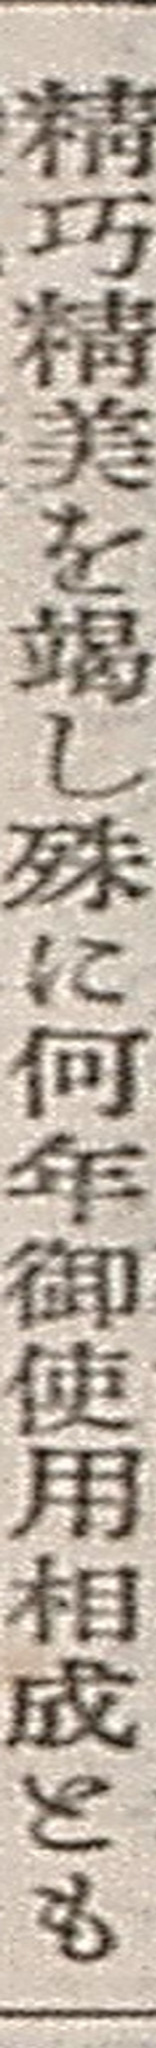精巧精美を竭し殊に何年御使用相成とも
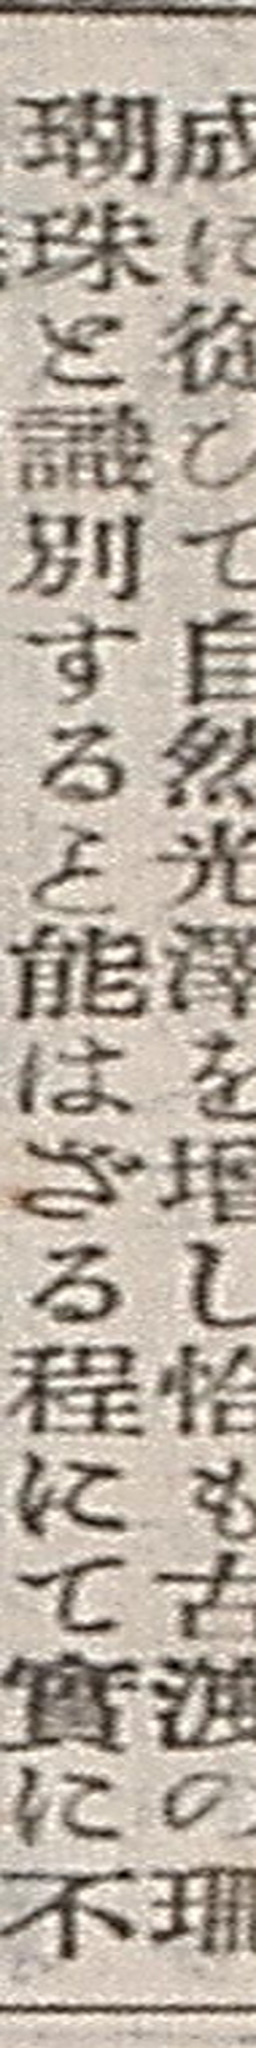瑚珠と識別すること能はざる程にて実に不
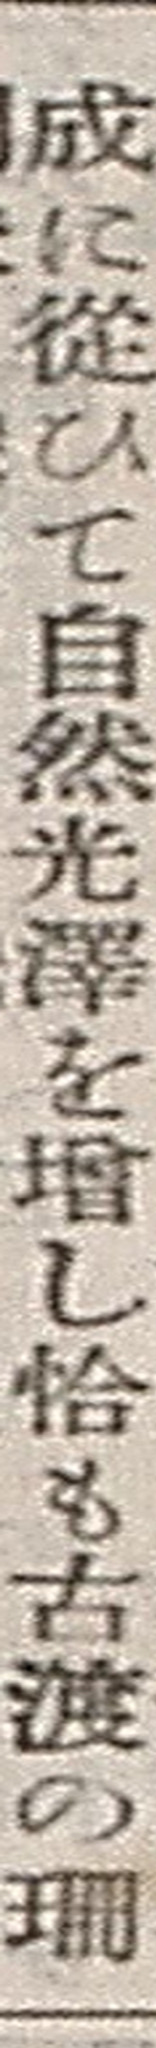成に従ひて自然光沢を増し恰も古渡の珊
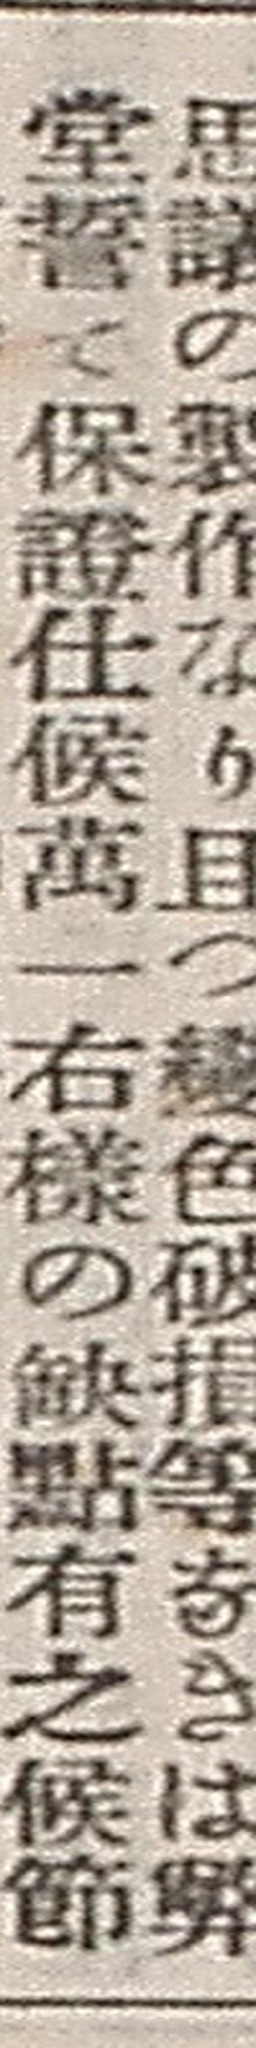堂誓て保證仕候万一左様の缺点有之候節
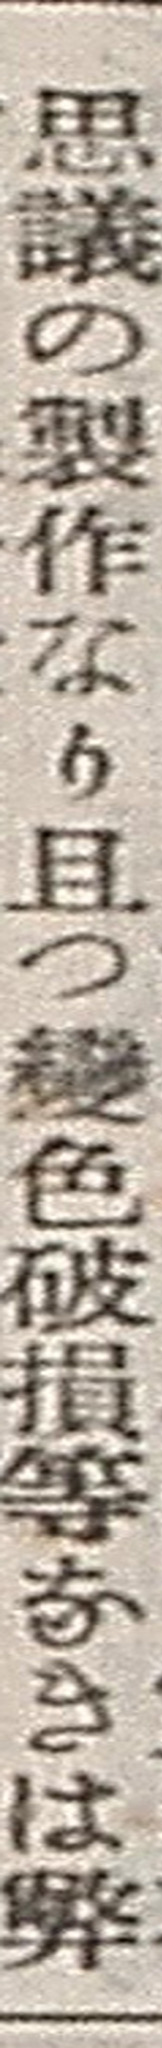思議の製作なり且つ変色破損等なきは弊
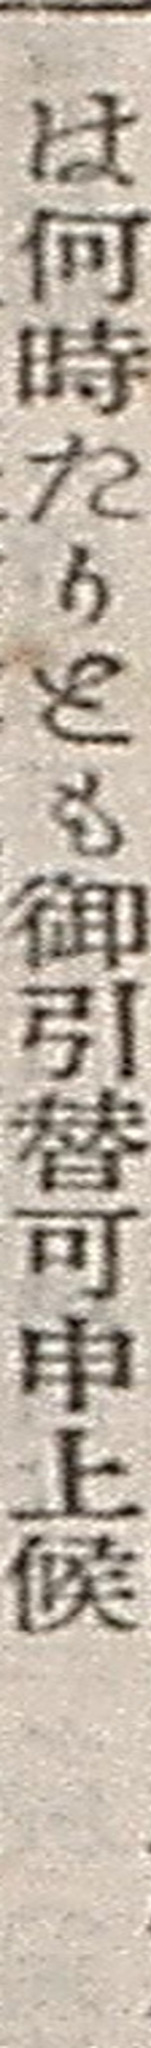は何時たりとも御引替可申上候
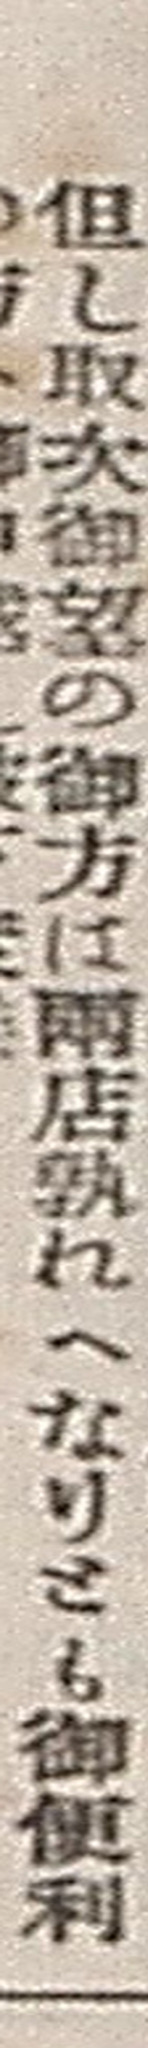但し取次御望の御方は兩店孰れへなりとも御便利
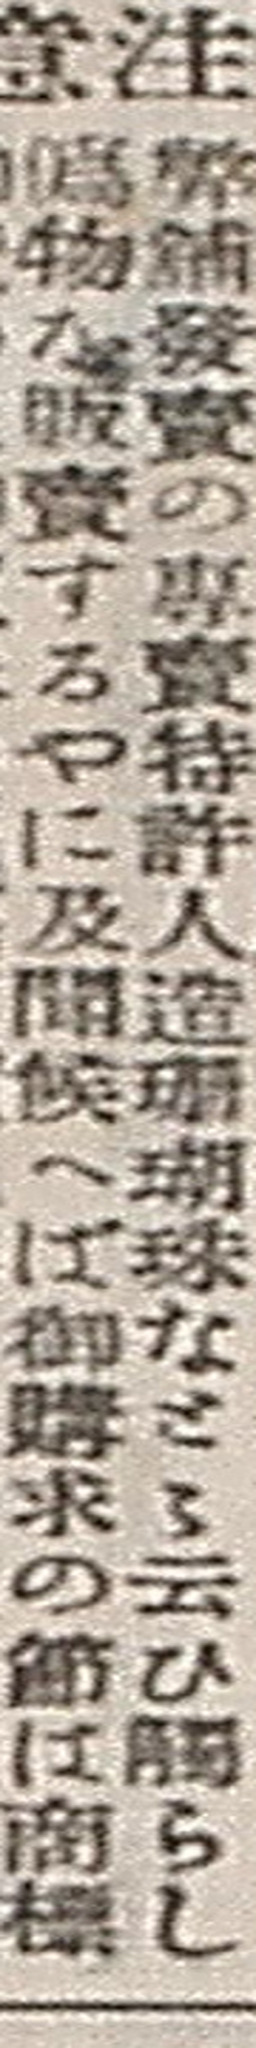偽物を販売するやに及聞候へば御贖求の節は商標
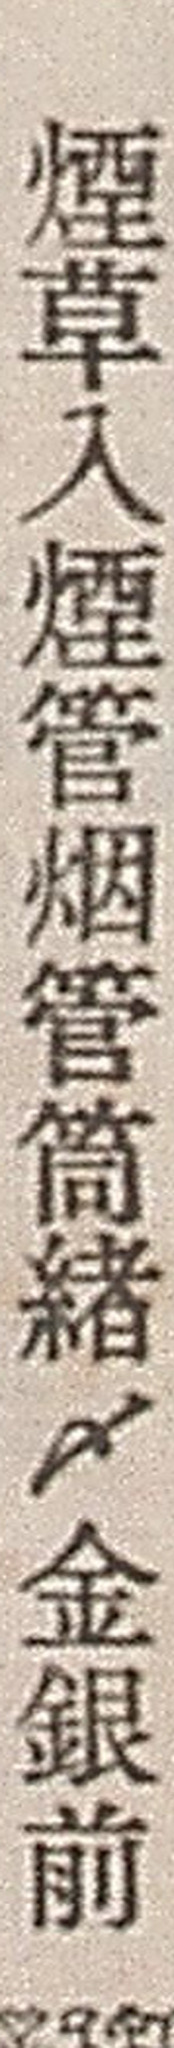煙草入煙管烟管筒緒〆金銀前
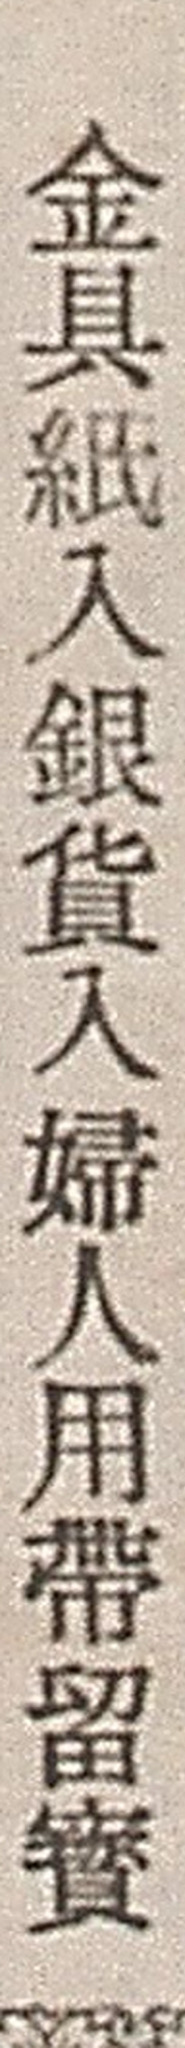金具紙入銀貨入婦人用帯留宝
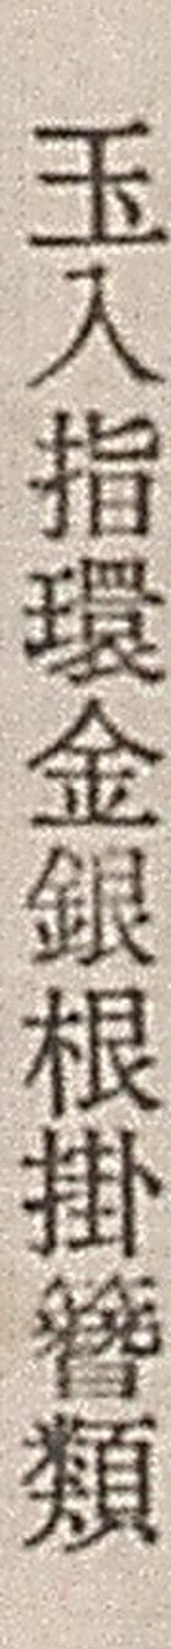玉入指環金銀根掛簪類
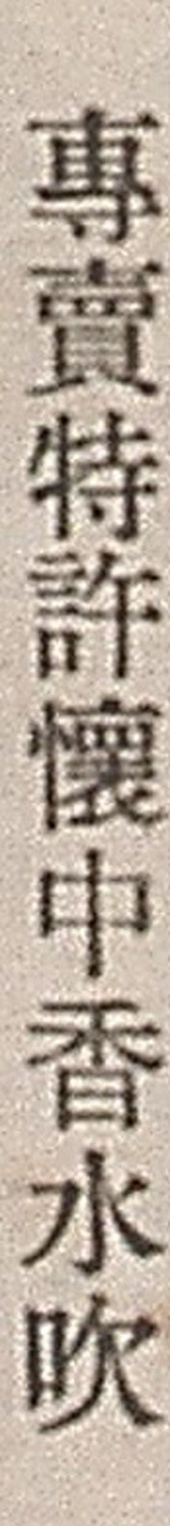専売特許懐中香水吹
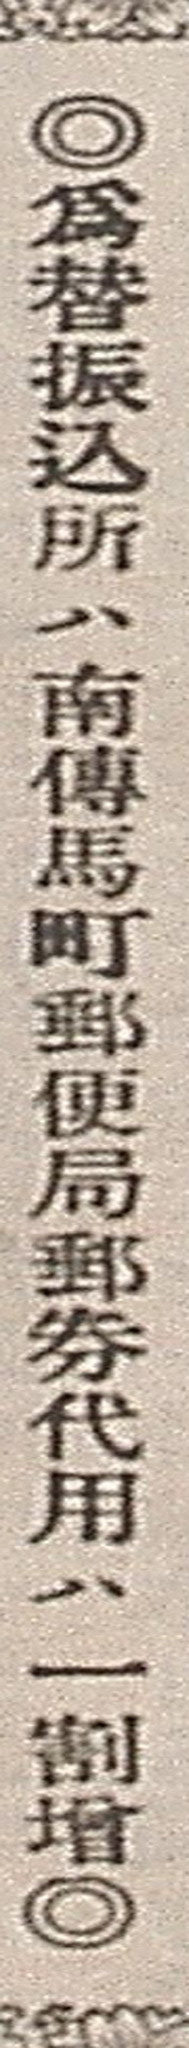◎為替振込は南伝馬町郵便局郵券代用は一割増◎
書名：風俗畫報臨時増刊第百二十八號　洪水被害録（下）
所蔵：東京大学地震研究所図書室 Earthquake Research Institute Library, The University of Tokyo, JAPAN
